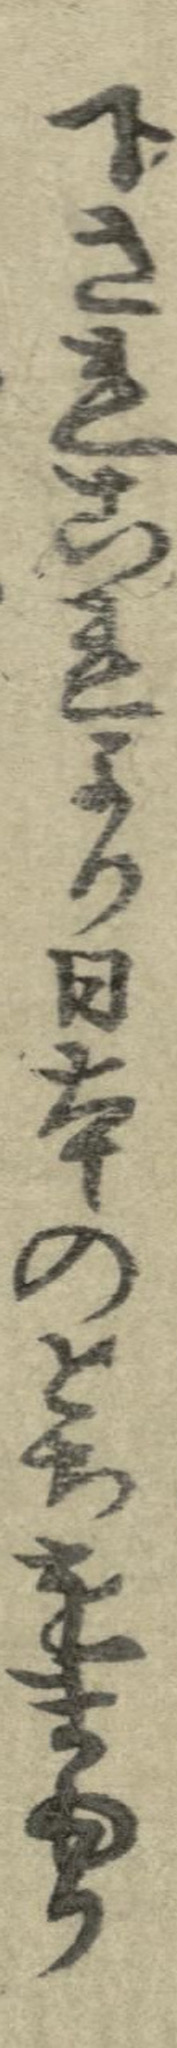下されこれより日本のとちをまもり
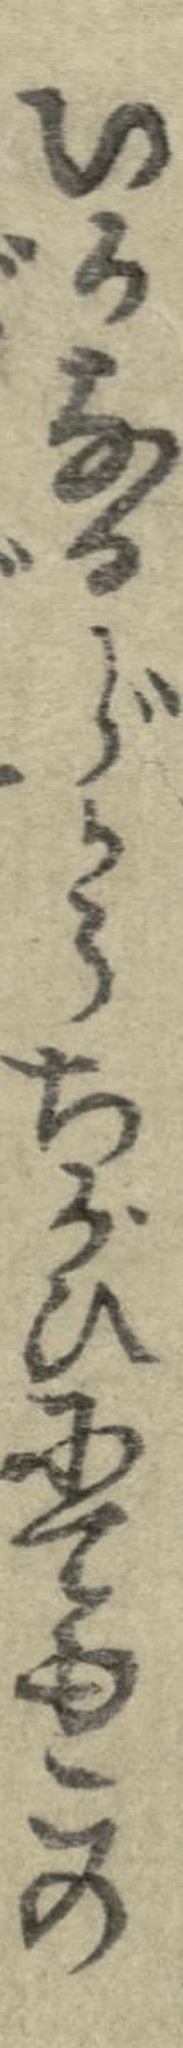いかなるじかうちがひにてもこの
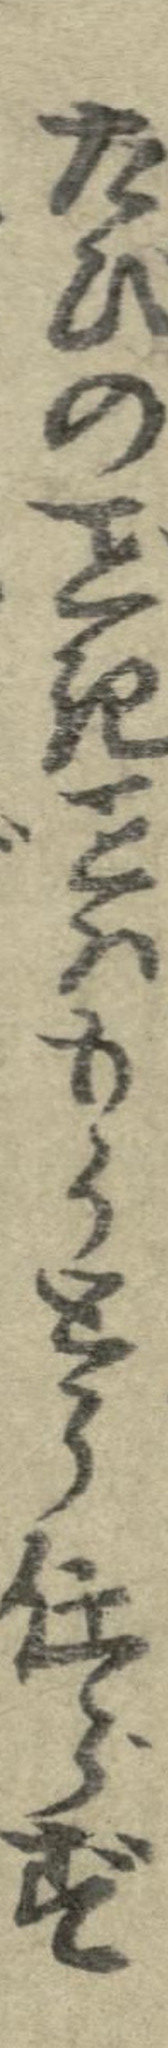たびのごときことはもうとう仕らず
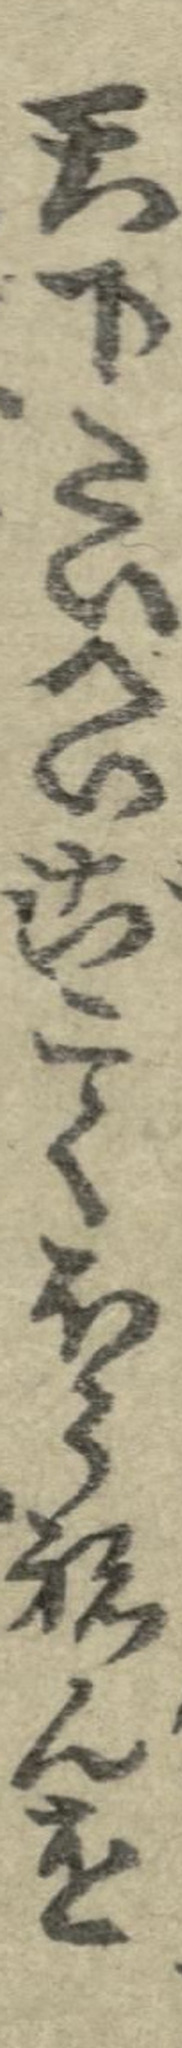天下たいへいごこくほうねんを
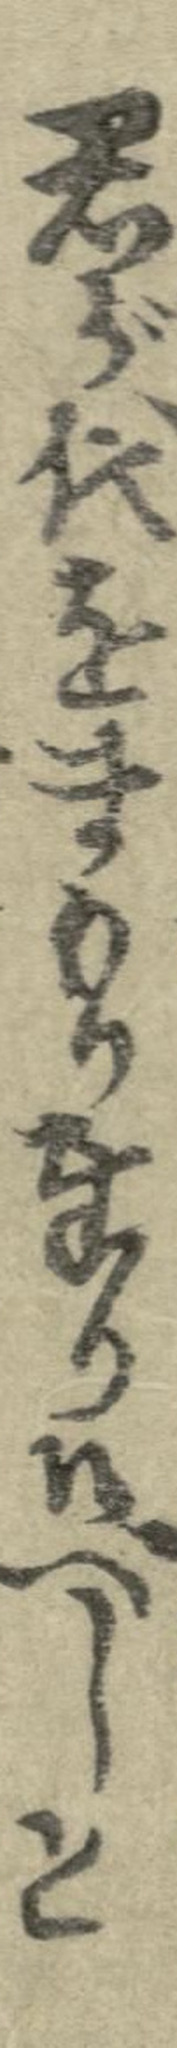君が代をまもり奉り候べしと
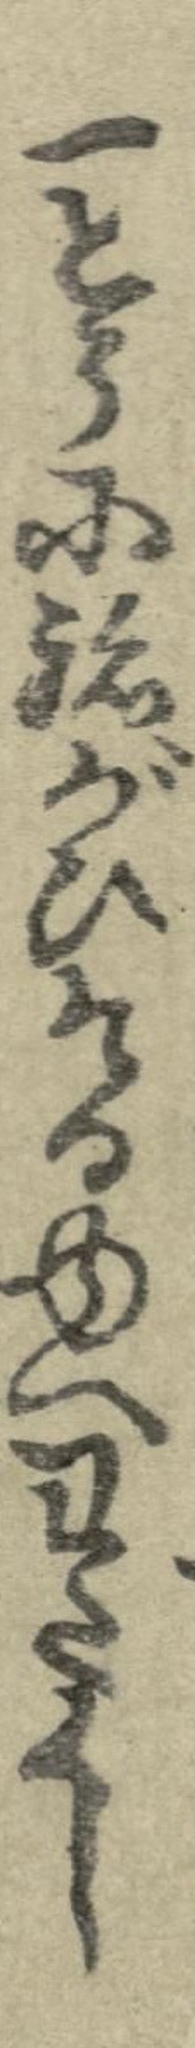一とうにねがひけるゆへわたくし
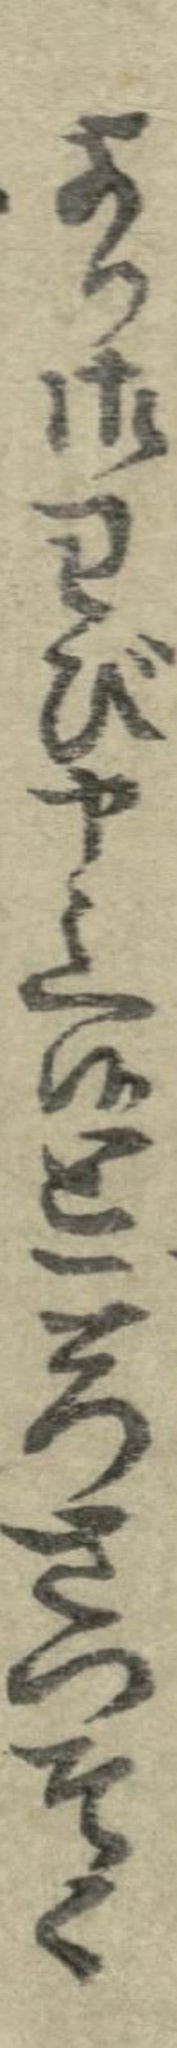より御わび申上候ところさつそく
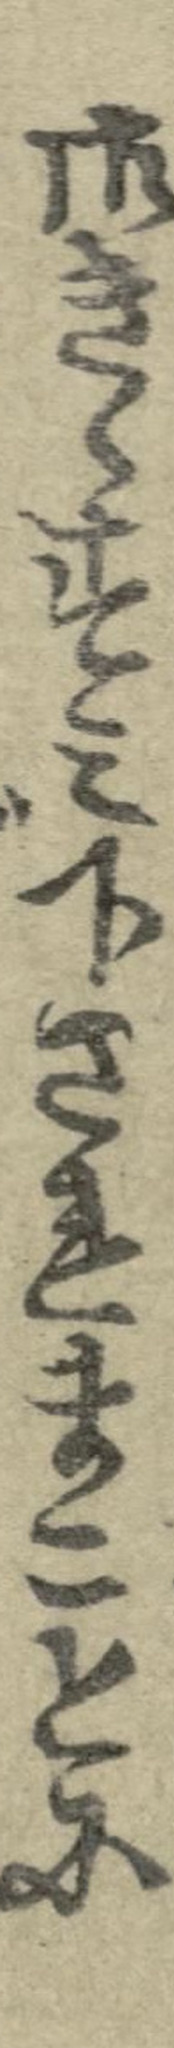御きゝすみ下されまことに
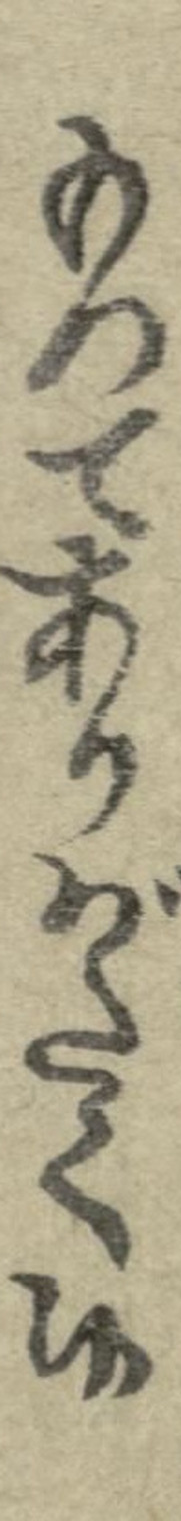もつてありがたく候
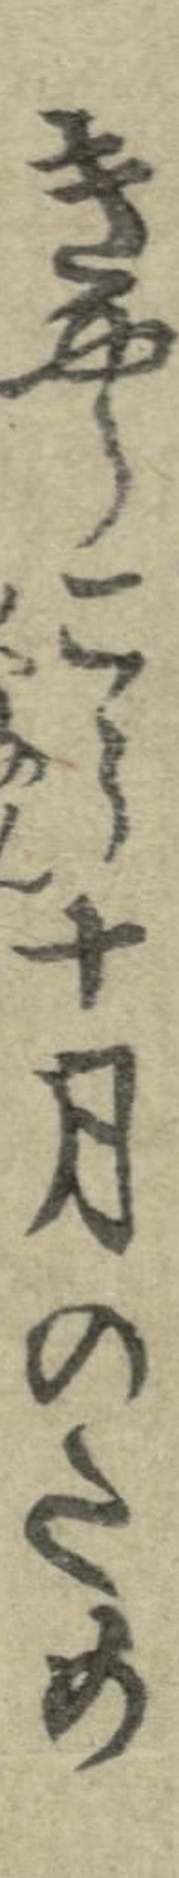きやうこう十月のため
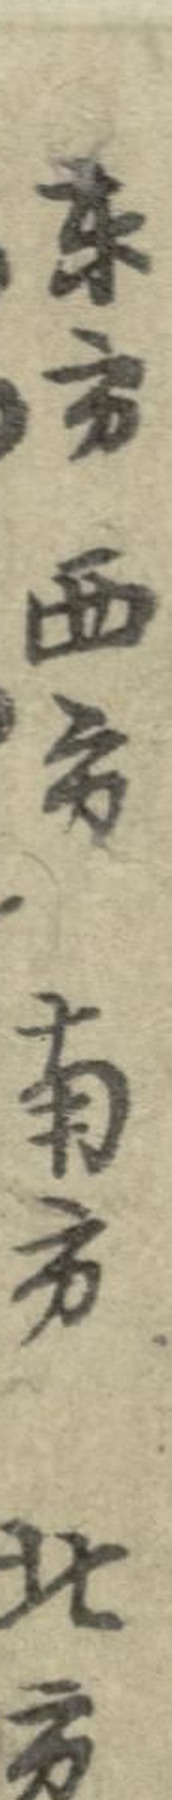東方西方南方北方
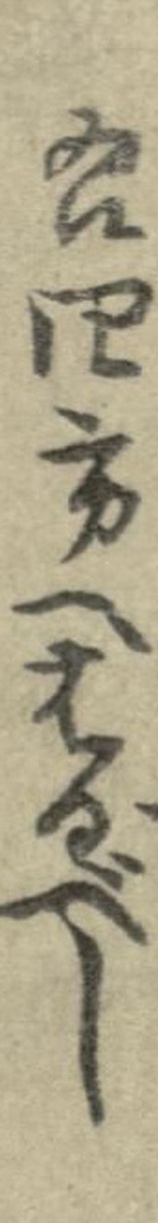右四方へはるべし
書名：恵比壽天申譯之記
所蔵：東京大学地震研究所図書室 Earthquake Research Institute Library, The University of Tokyo, JAPAN
